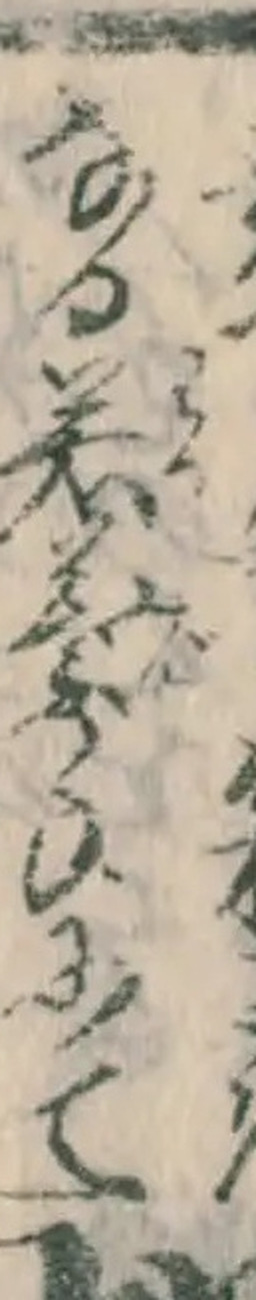なる若葉手にて
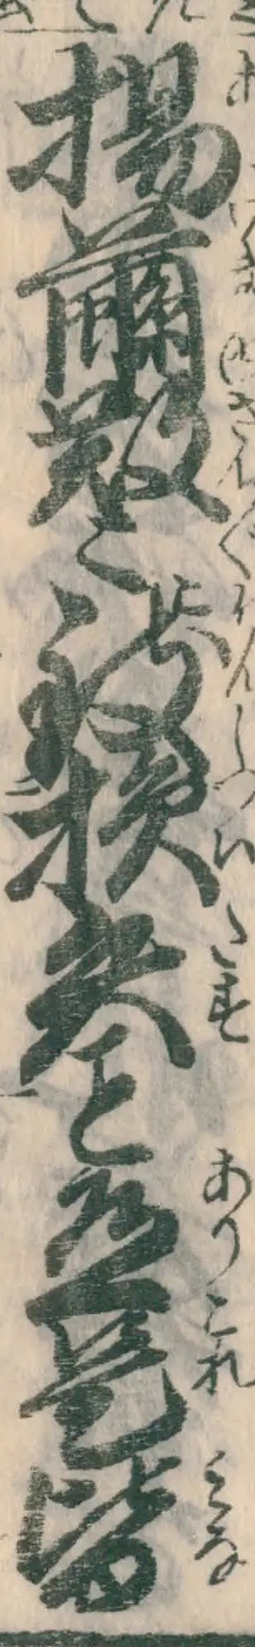揚繭散々に致損失こと有是皆
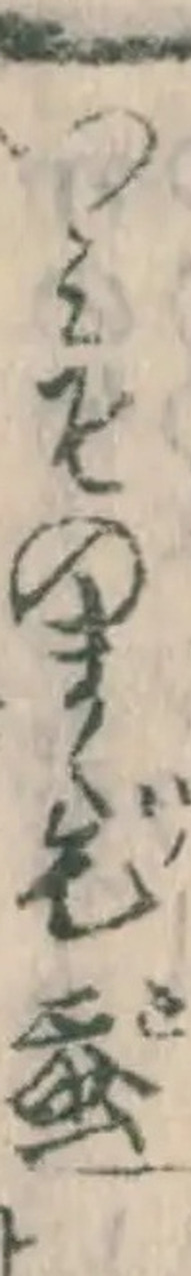つみそのまゝ毛蚕
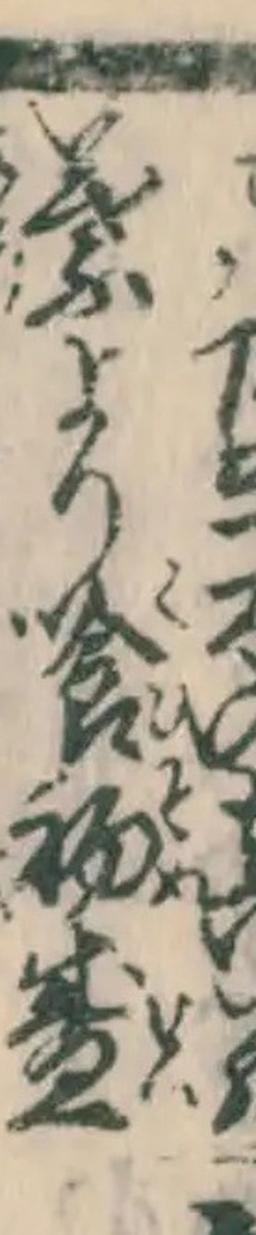葉より喰初盛
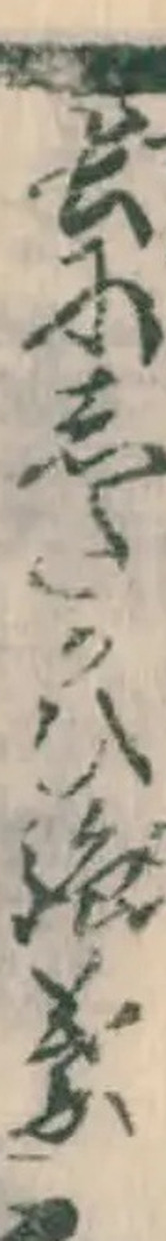長にしたがい強葉
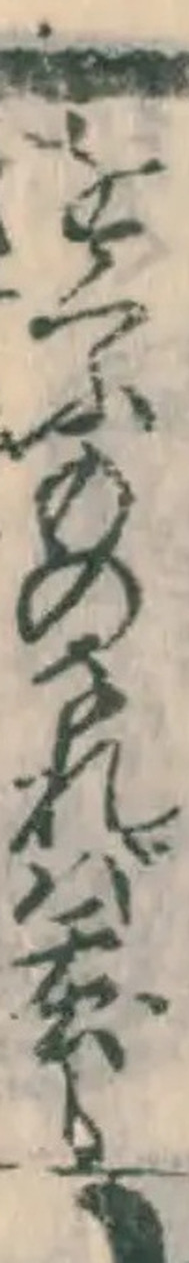をくふものなれば蚕も
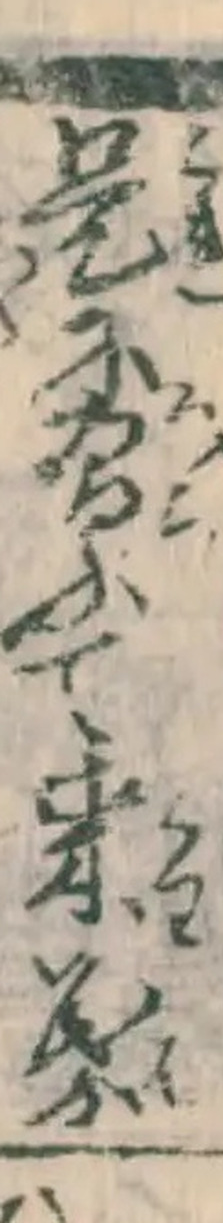是に習ふて桑葉
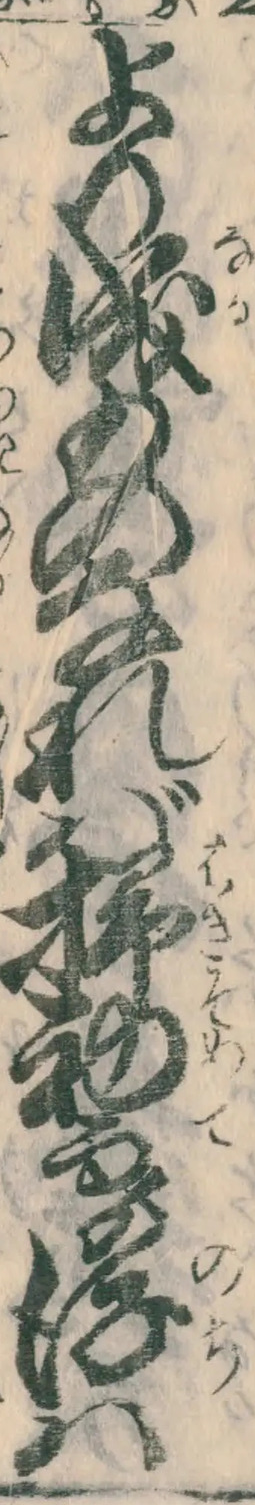より成ものなれば掃初而ゟ後は
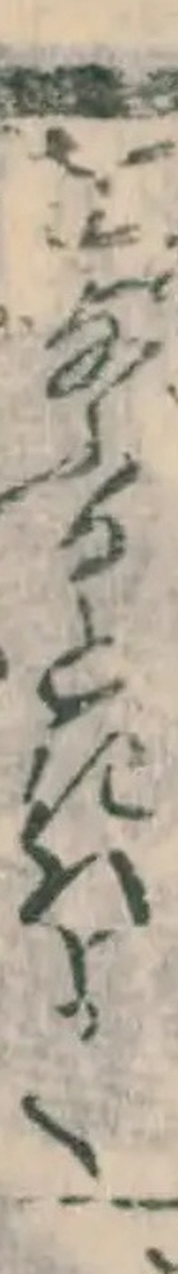を与ふるときはよく
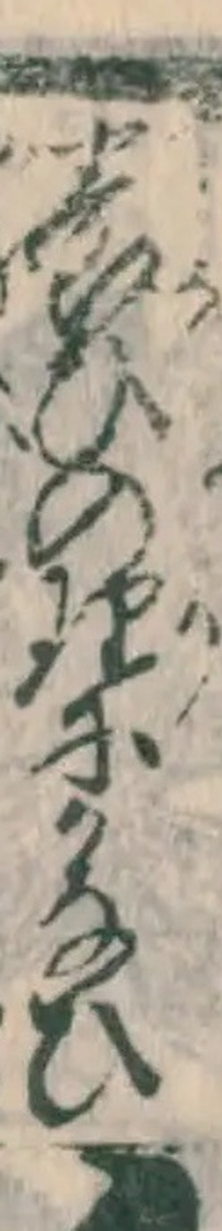養ひの理にかなひ
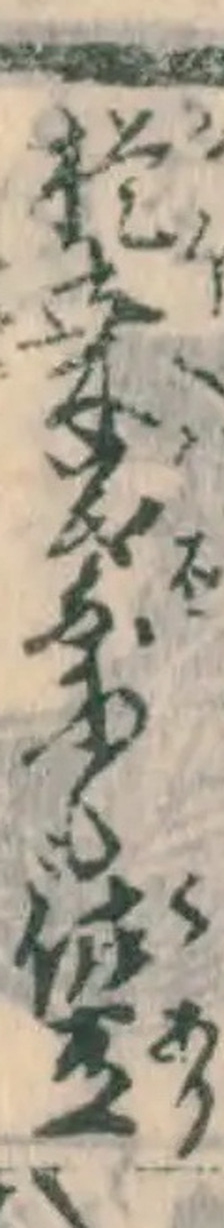猶桑葉にも徳有
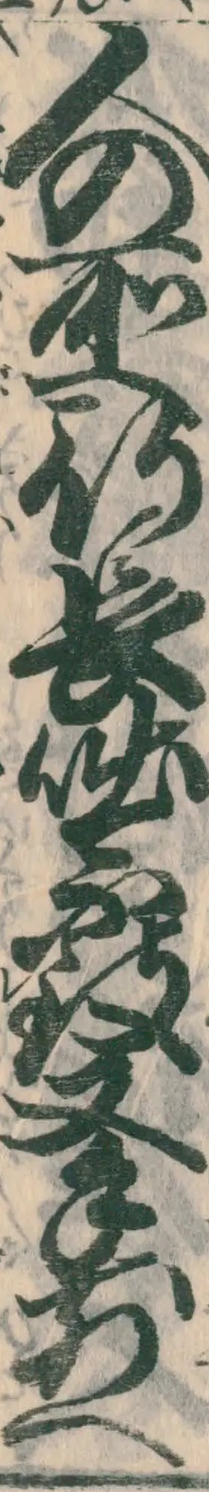人の所へ行長咄不致又手前へ
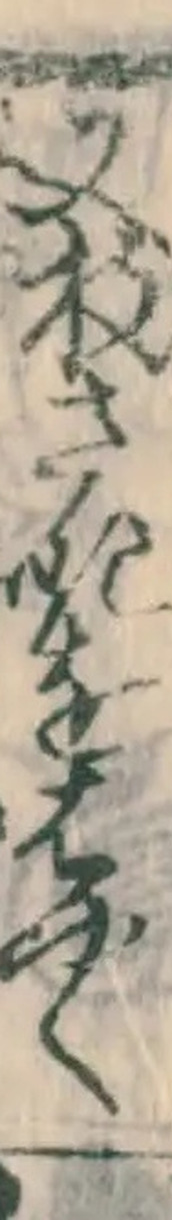又枝さきをはやく
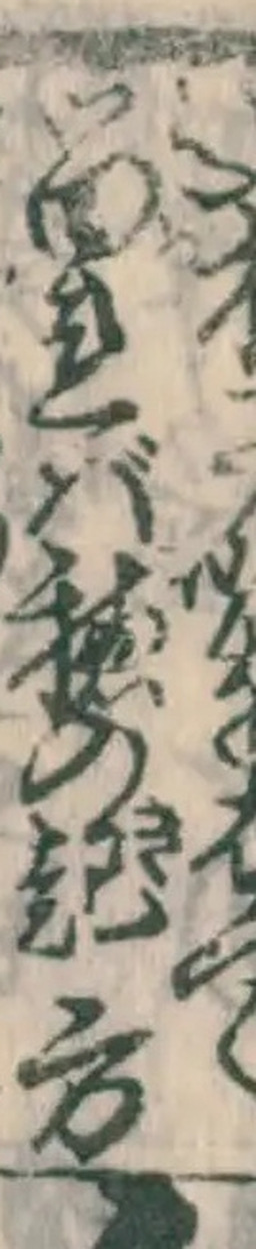留れば穂の起方
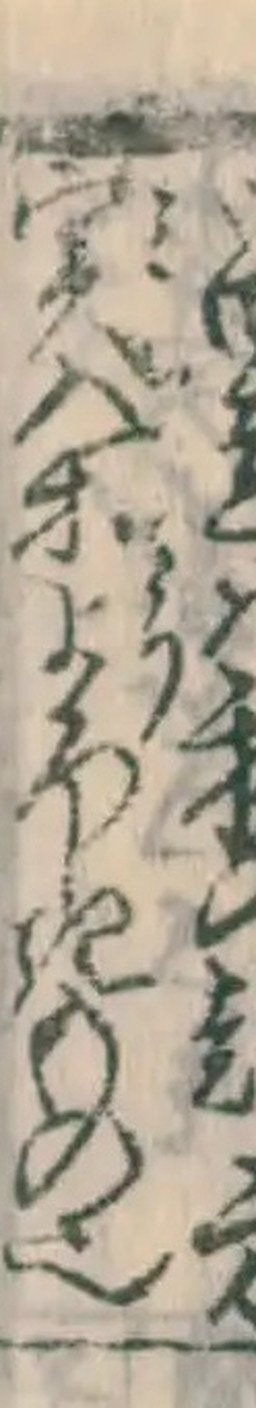実入等よろしきもの也
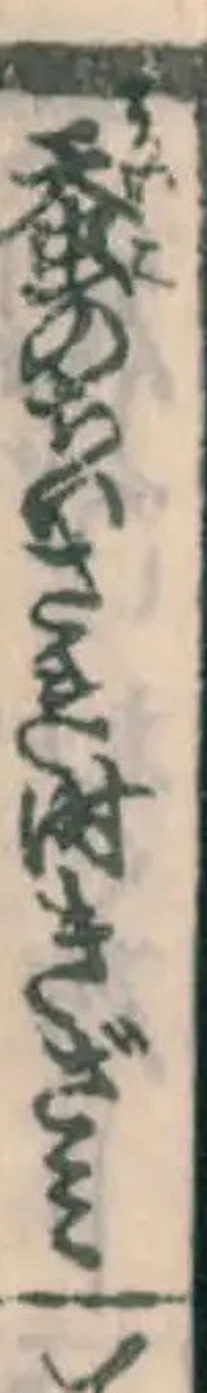蚕のちいさき時きざみ
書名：養蚕往来
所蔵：国立国会図書館 National Diet Library, JAPAN
